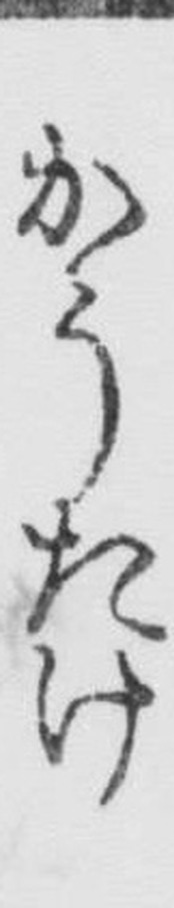かうたけ
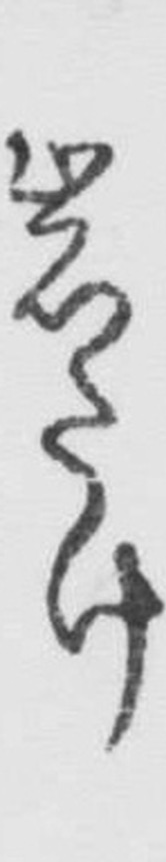岩たけ
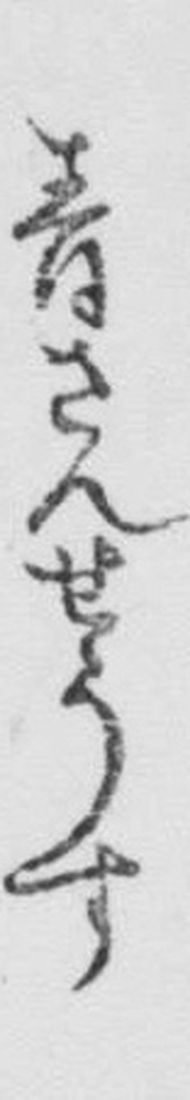青さんせうす
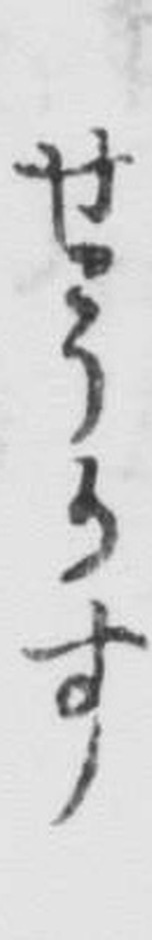せうかす
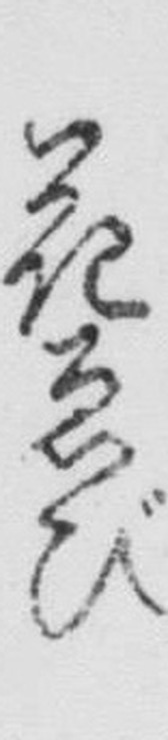花ゑび
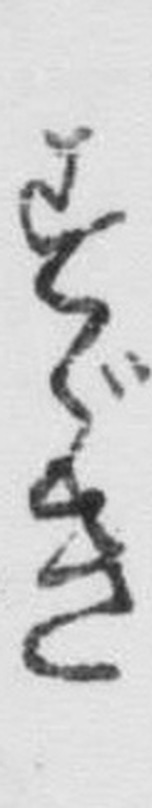すゞき
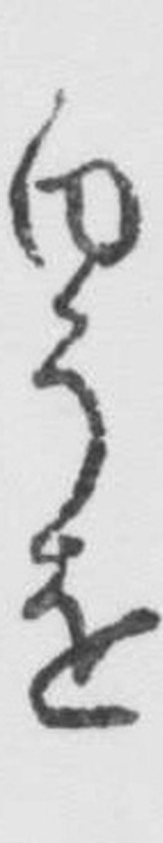白うを
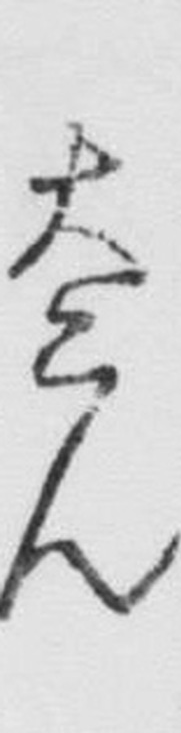大こん
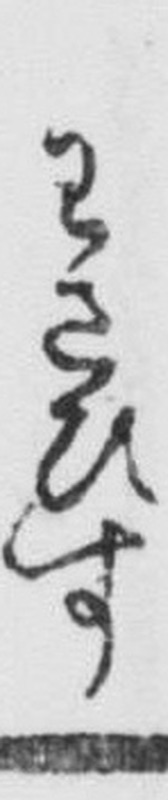わさびす
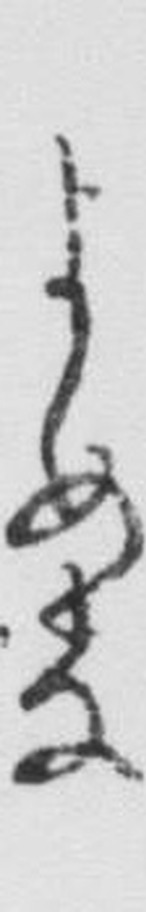よめな
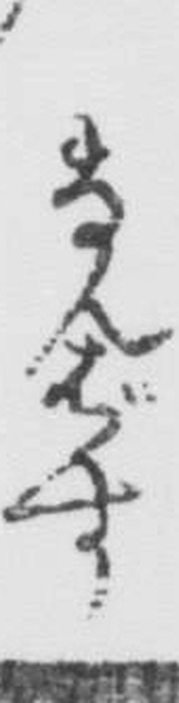なんばす
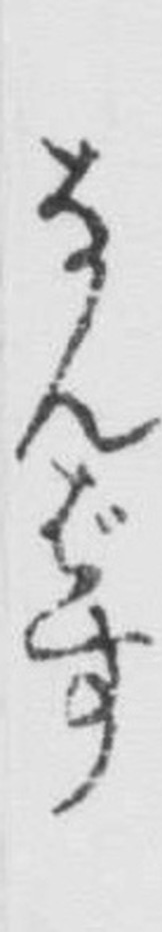なんばす
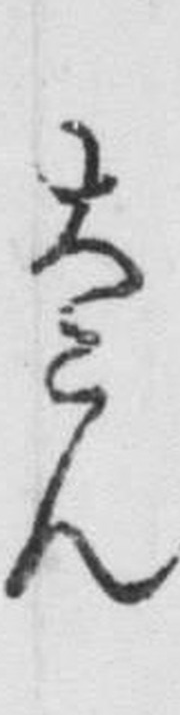大こん
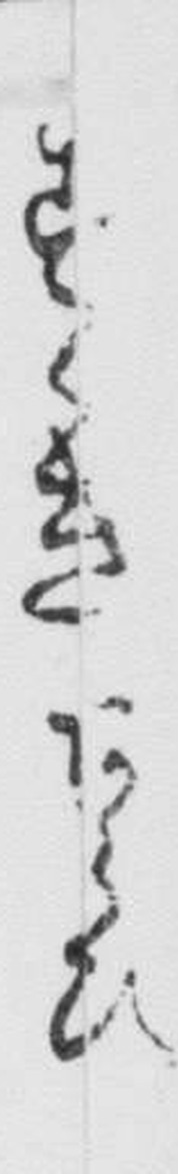すゞきあらひ
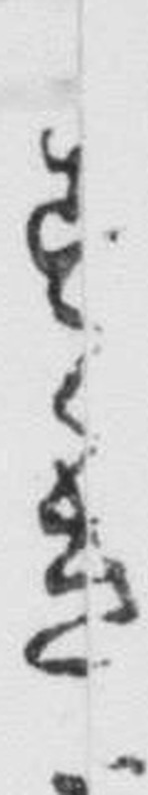すゞき
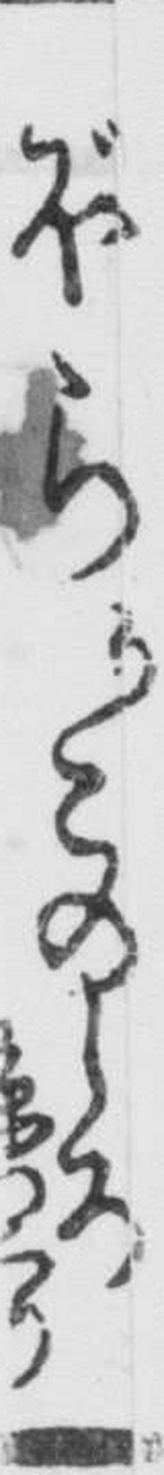ぼらかこのしろ
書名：諸家通用/即席料理
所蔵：大阪府立大学学術情報センター 国文学研究資料館
